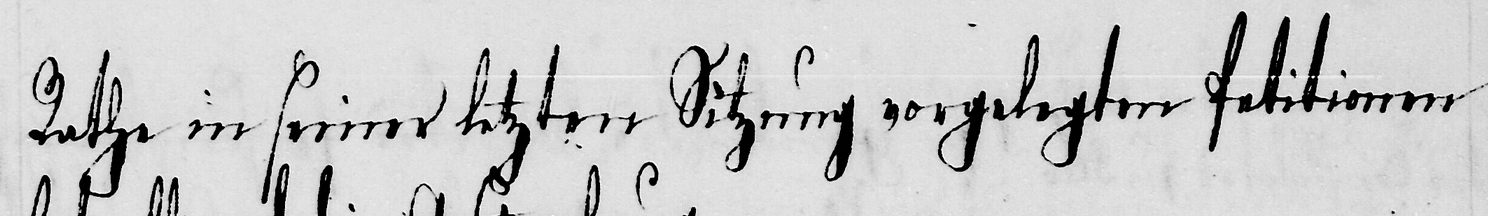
Rathe in seiner letzten Sitzung vorgelegten Petitionen
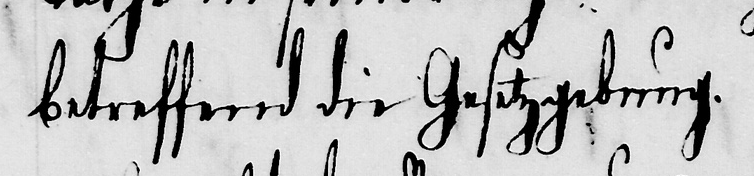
betreffend die Gesetzgebung.
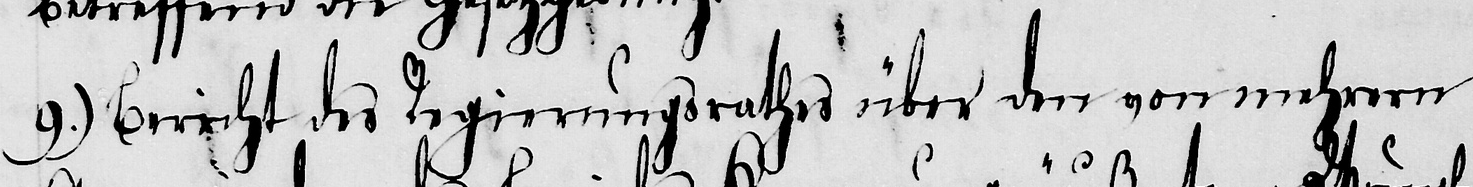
9.) Bericht des Regierungsrathes über den von mehreren
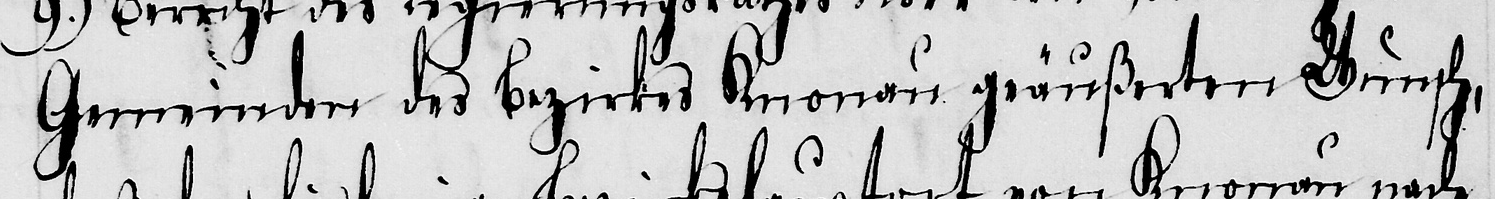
Gemeinden des Bezirkes Knonau geäußerten Wunsche,
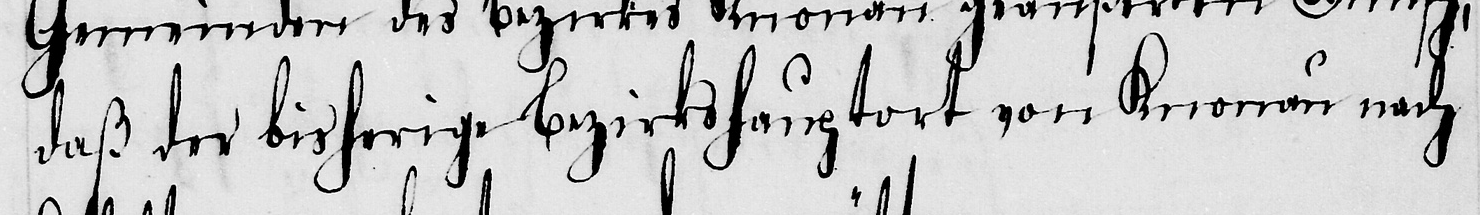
daß der bisherige Bezirkshauptort von Knonau nach
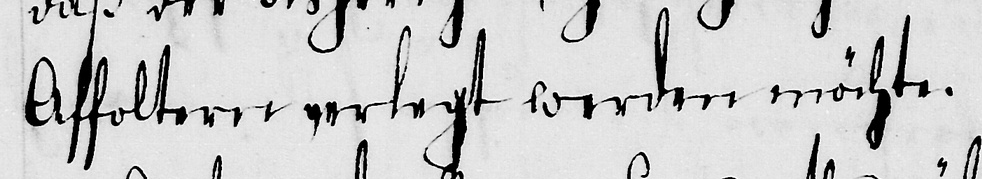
Affoltern verlegt werden möchte.
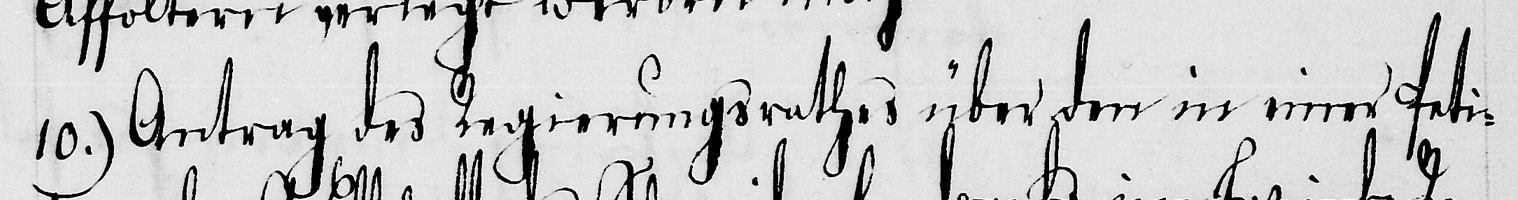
10.) Antrag des Regierungsrathes über den in einer Peti¬
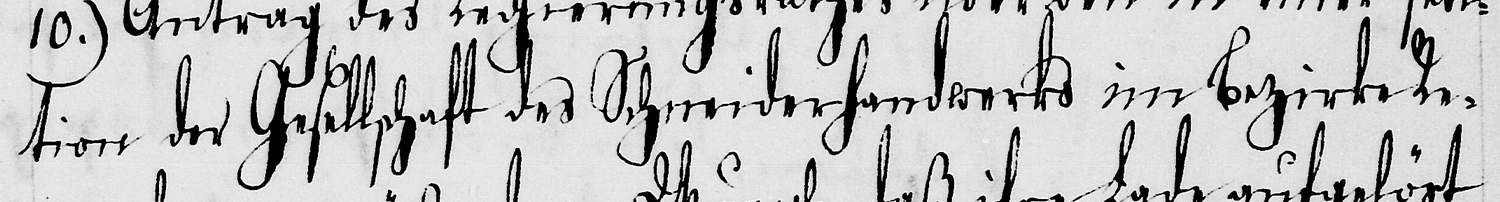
der Gesellschaft des Schneiderhandwerks im Bezirke Re¬
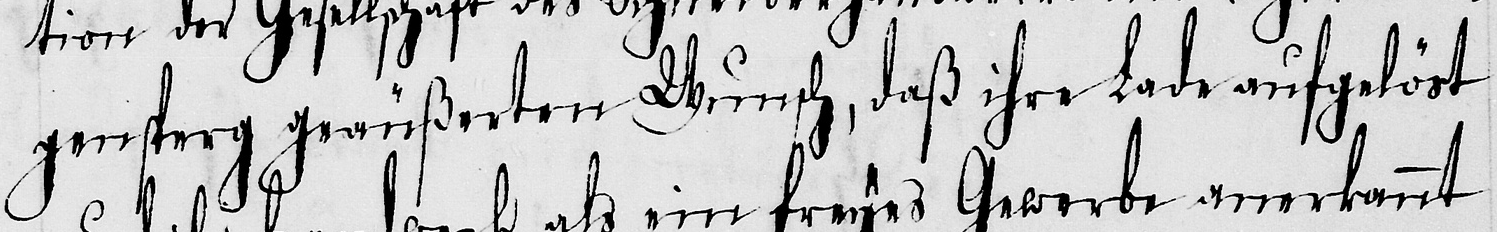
gensperg geäußerten Wunsch, daß ihre Lade aufgelöst
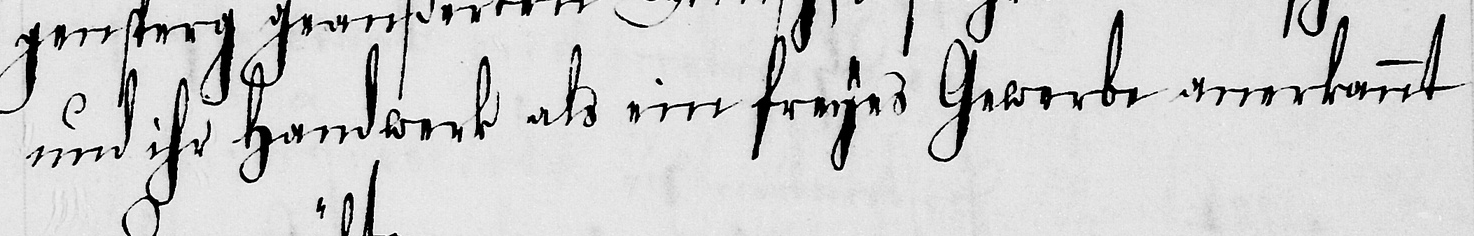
und ihr Handwerk als ein freyes Gewerbe anerkannt
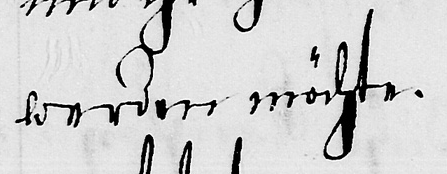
werden möchte.
